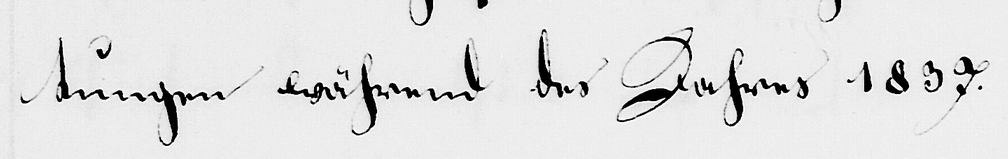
tungen während des Jahres 1837.
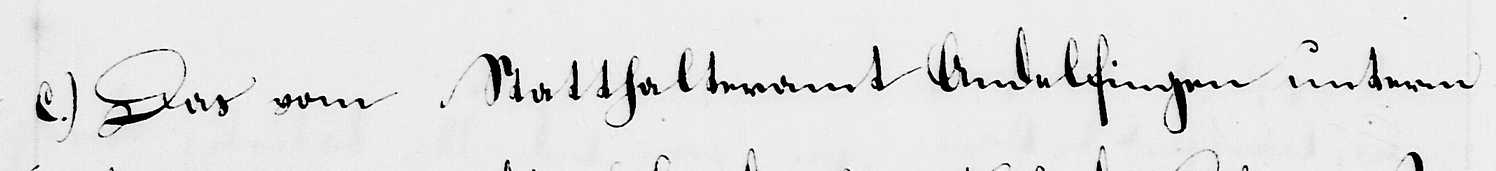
c.) Das vom Statthalteramt Andelfingen unterm
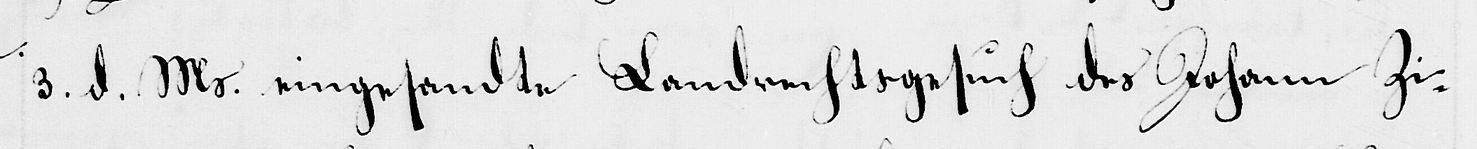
3. d. Ms. eingesandte Landrechtsgesuch des Johann Zi¬
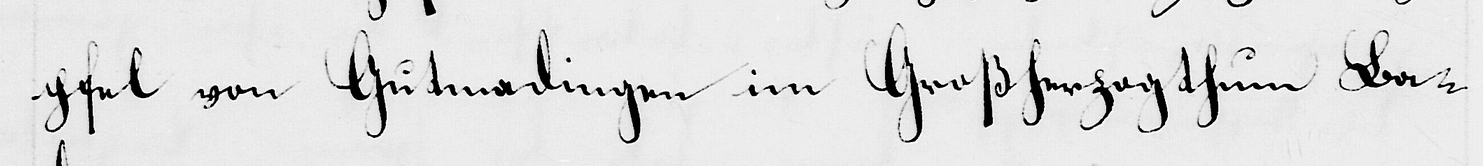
pfel von Gutmadingen im Großherzogthum Ba¬
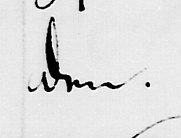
den.
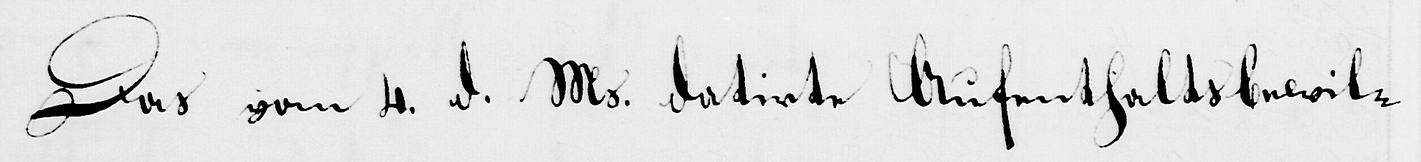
Das vom 4. d. Ms. datirte Aufenthaltsbewil¬
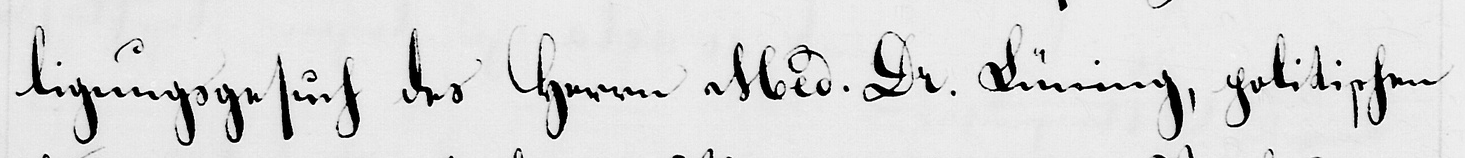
ligungsgesuch des Herrn Med. Dr. Lüning, politischen
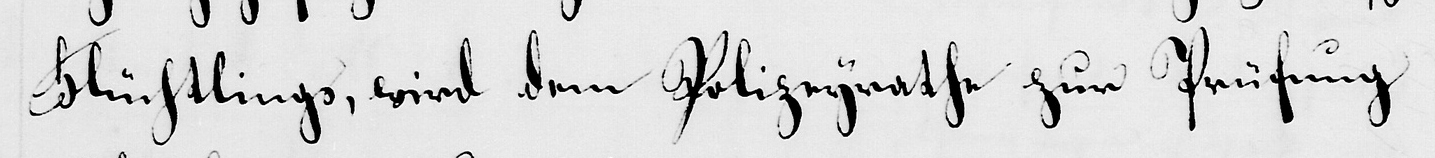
Flüchtlings, wird dem Polizeyrathe zur Prüfung
